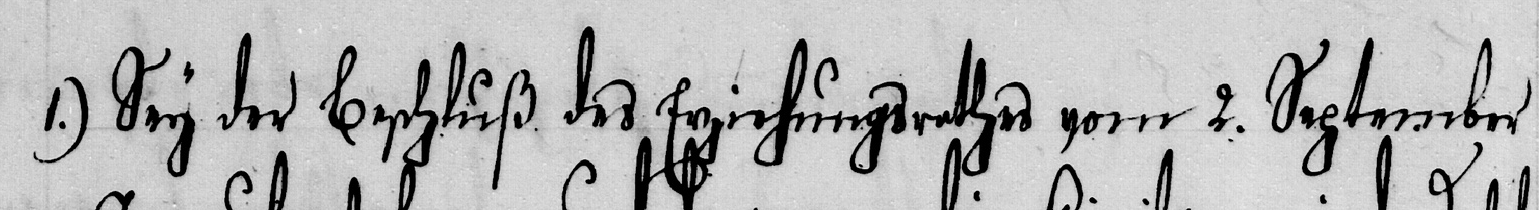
1.) Sey der Beschluß des Erziehungsrathes vom 2. September
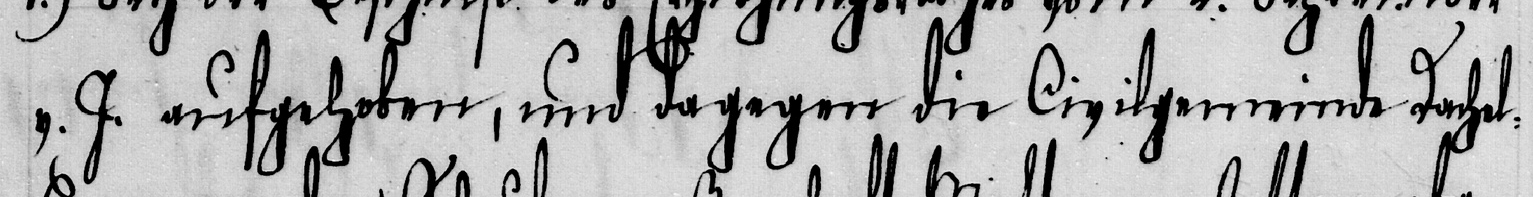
v. J. aufgehoben, und dagegen die Civilgemeinde Dache¬
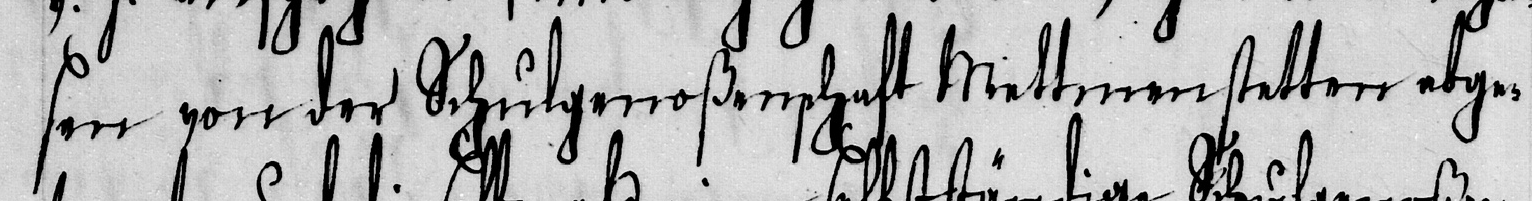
lsen von der Schulgenoßenschaft Mettmenstetten abge¬
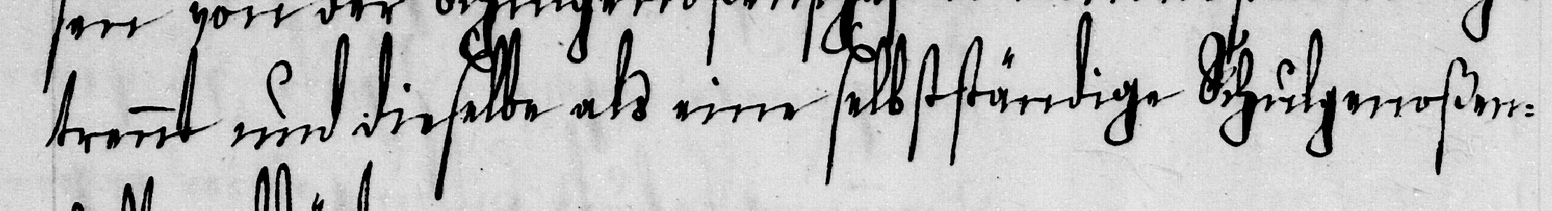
trennt und dieselbe als eine selbstständige Schulgenoßen¬
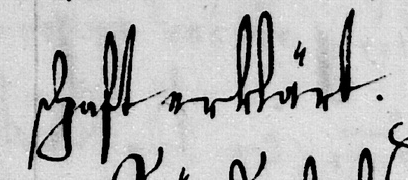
chaft erklärt.
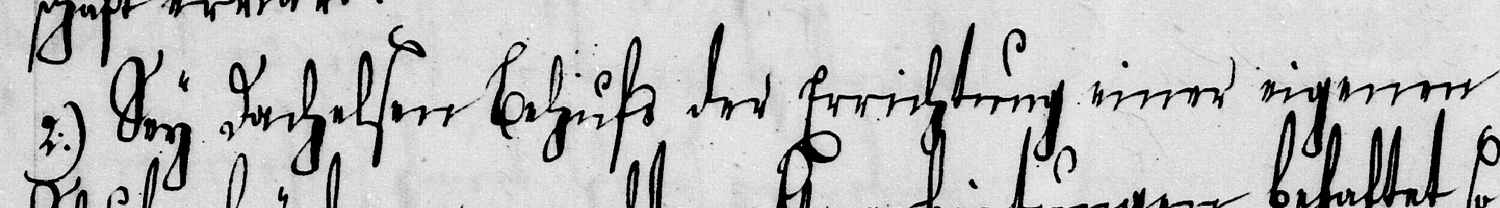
2.) Sey Dachelsen Behufs der Errichtung einer eigenen
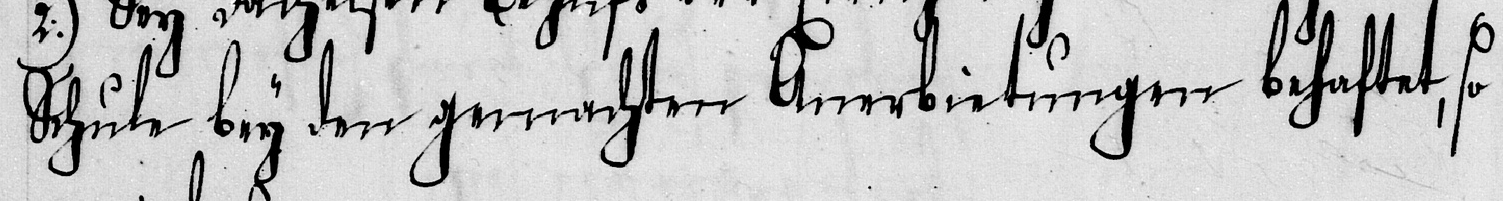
Schule bey den gemachten Anerbietungen behaftet, so
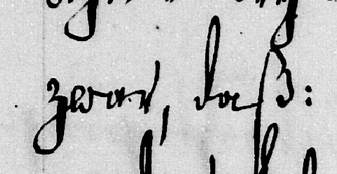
zwar, daß:
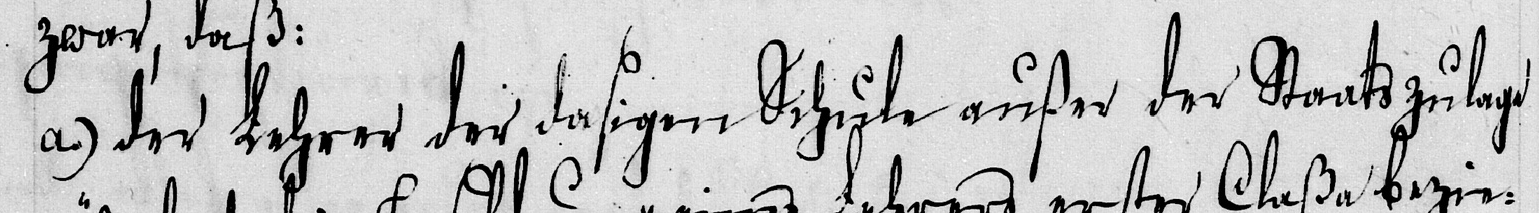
a.) der Lehrer der dasigen Schule außer der Staatszulage
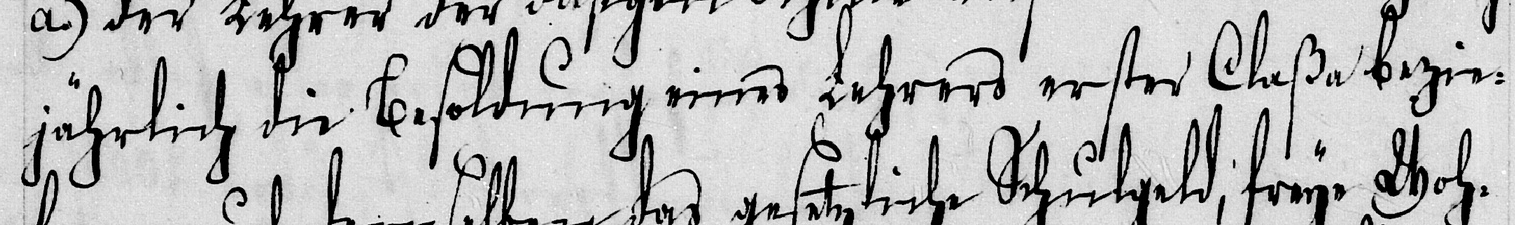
jährlich die Besoldung eines Lehrers erster Claße bezie¬
